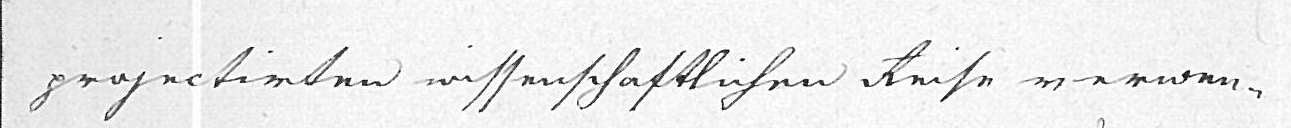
projectirten wissenschaftlichen Reise verwen-
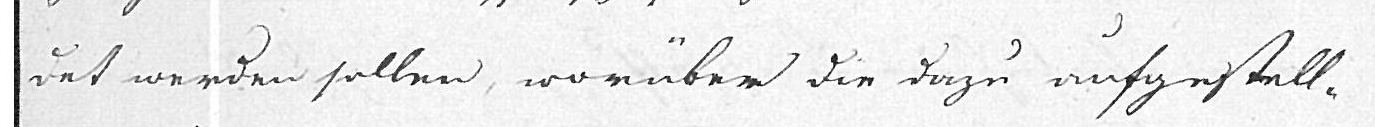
det werden sollen, worüber die dazu aufgestellte
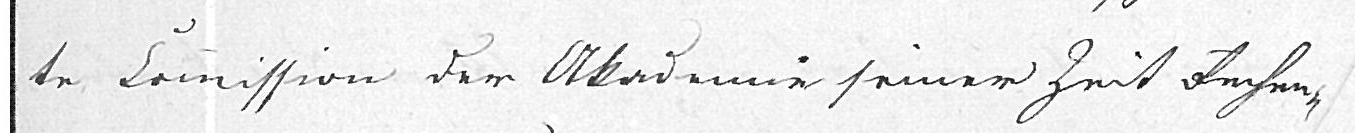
Commission der Akademie seiner Zeit Rechen-
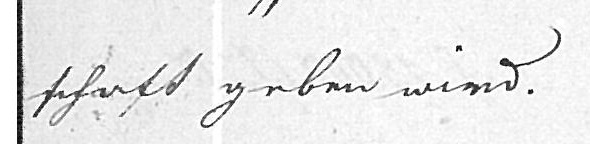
schaft geben wird.
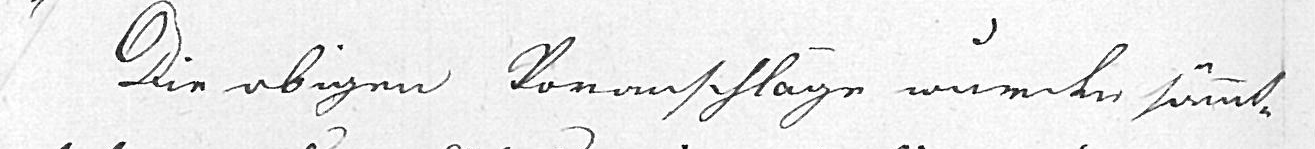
Die obigen Voranschläge wurden sämmt-
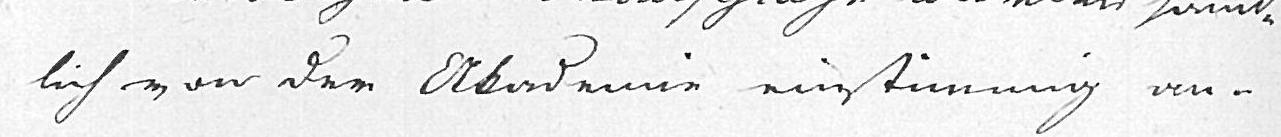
lich von der Akademie einstimmig an-
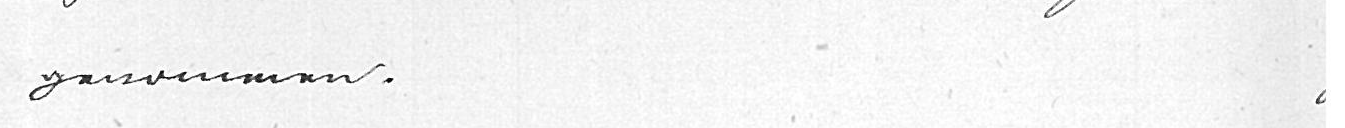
genommen.
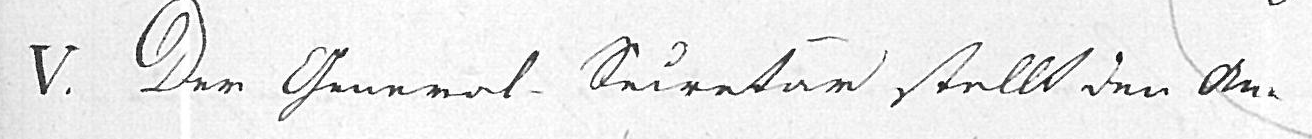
V. Der General-Secretär stellt den An-
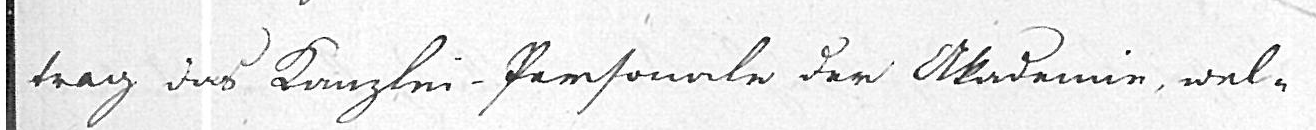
trag das Kanzlei-Personale der Akademie, wel-
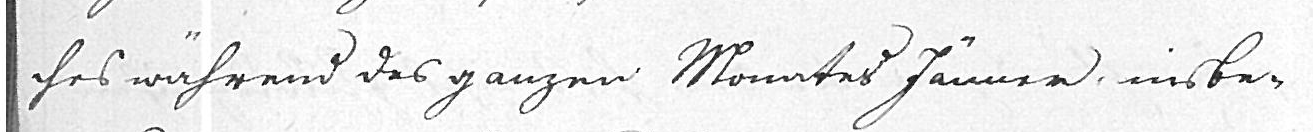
ches während des ganzen Monates Jänner insbe-
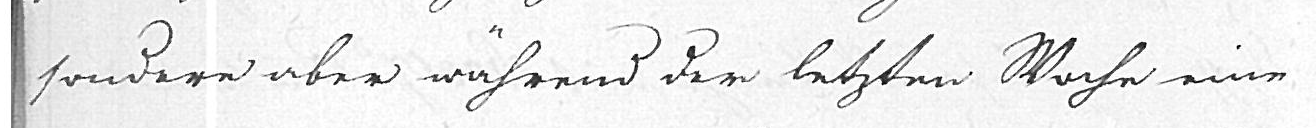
sondere aber während der letzten Woche eine
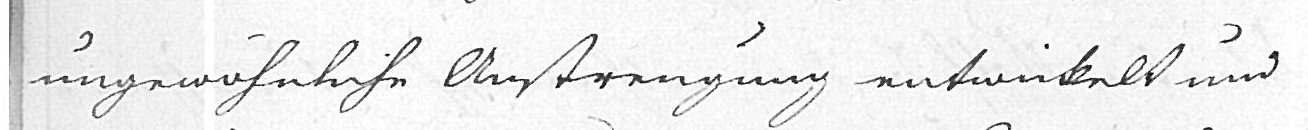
ungewöhnliche Anstrengung entwickelt und
